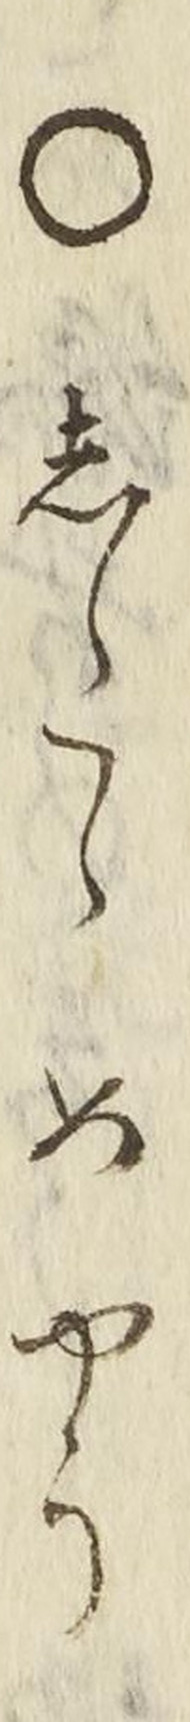○したゝめやう
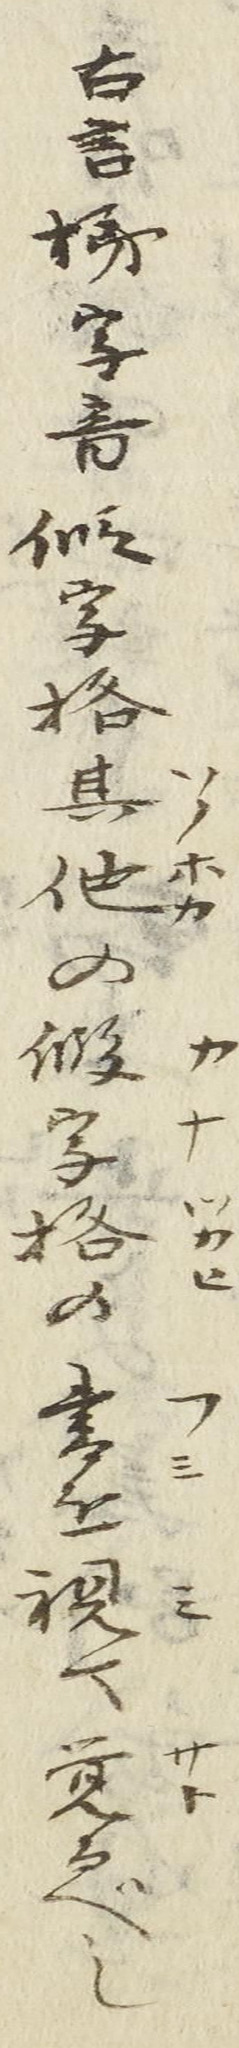古言梯字音仮字格其他の仮字格の書を視て覚るべし
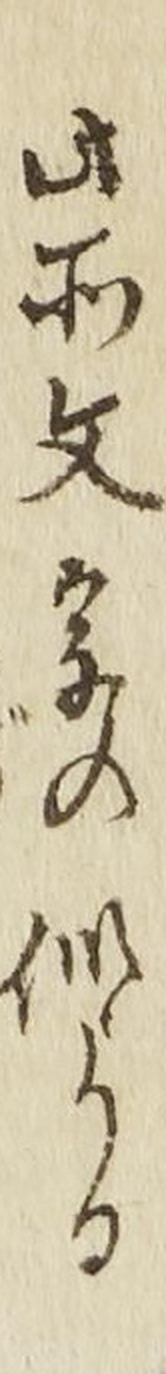此所文字の似よる
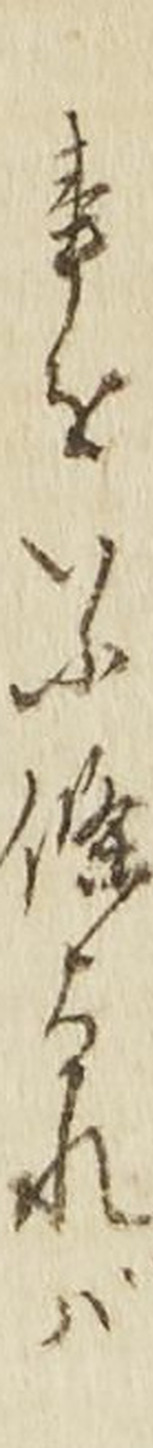事をいふ条なれば
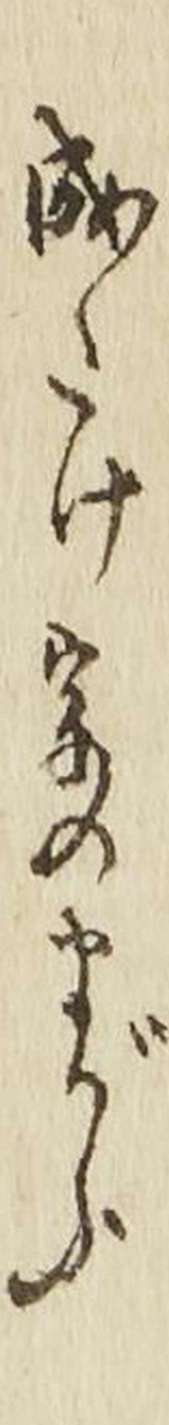成たけ字のまがふ
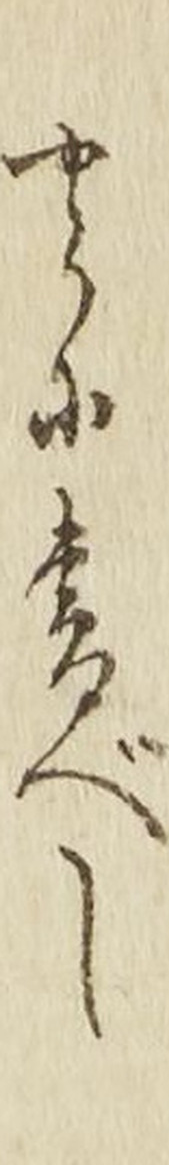やうに書べし
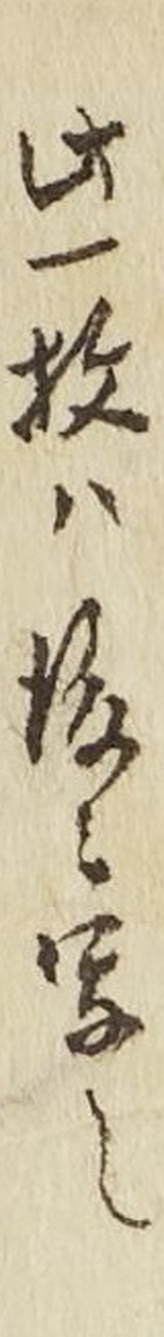此一枚は後〻写し
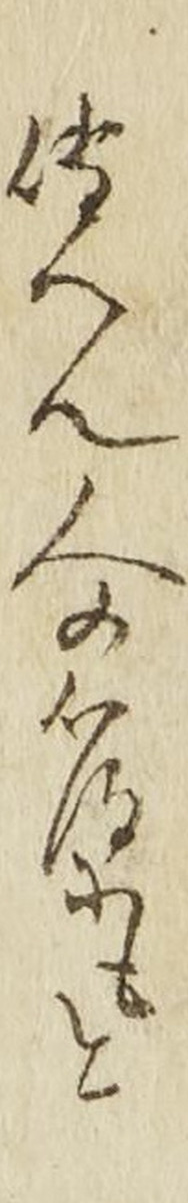伝えん人の心得にもと
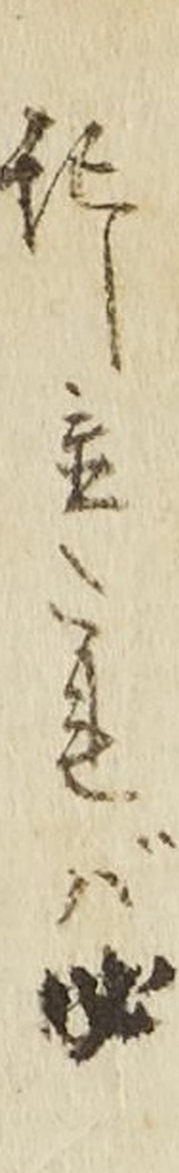記し置たれば必
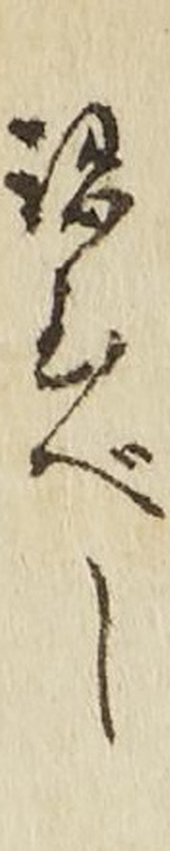認むべし
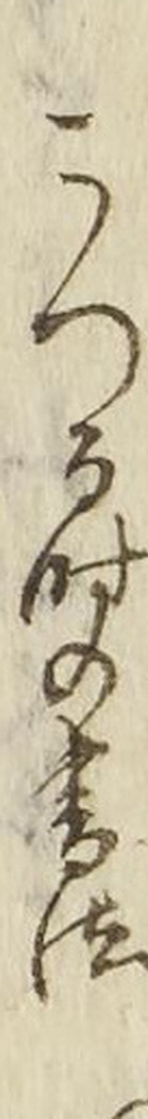うつる時の書法

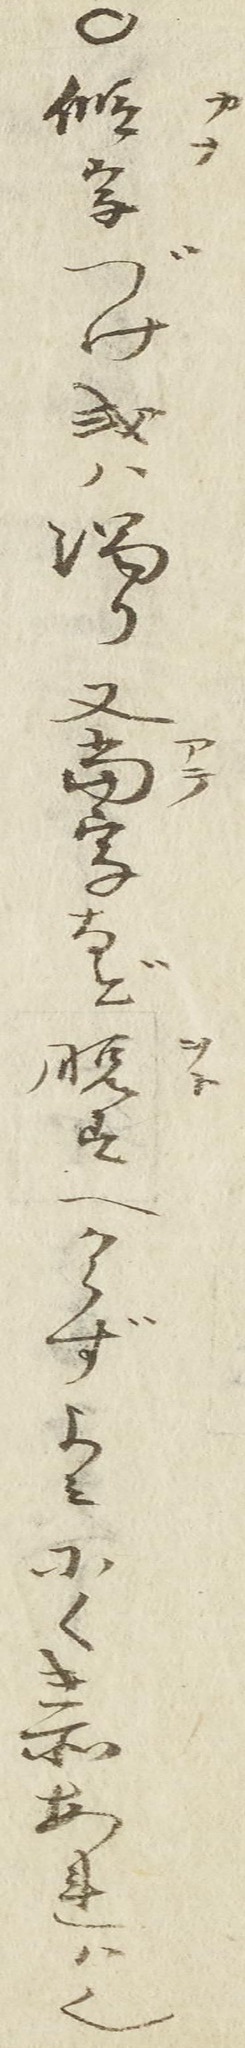○仮字づけ或は濁り又当字など脱すへからずよみにくき所あれは也
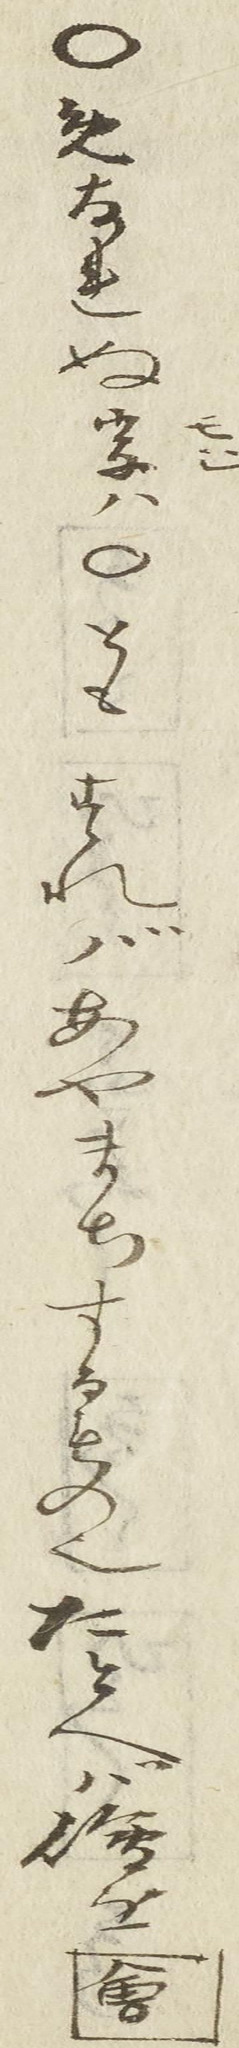○めなれに字は○ともすればあやまちするもの也たとへは繪を會
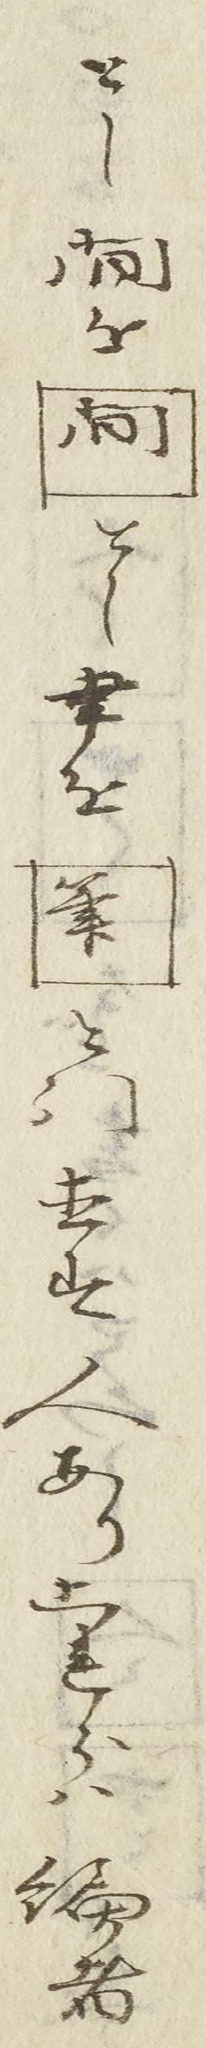とし間を問とし書を筆と引直す人ありこれらは編者
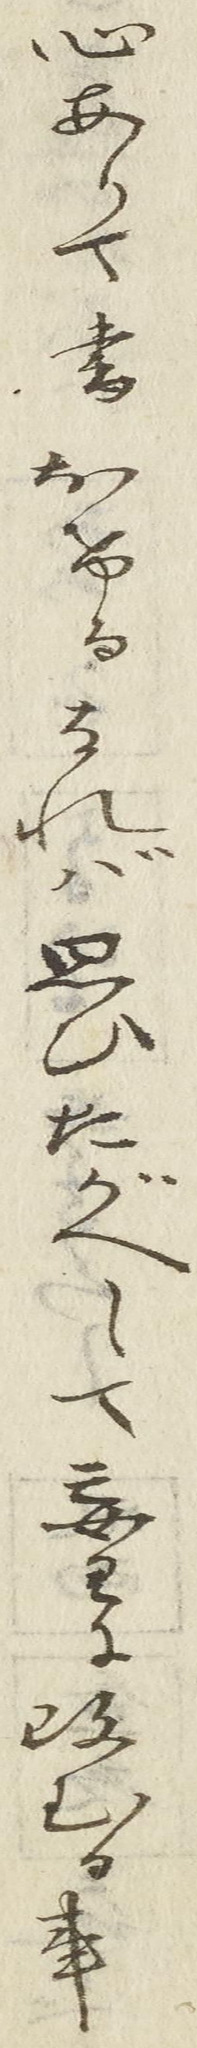心ありて書おけるなれば思ひたがへして妄りに改むる事
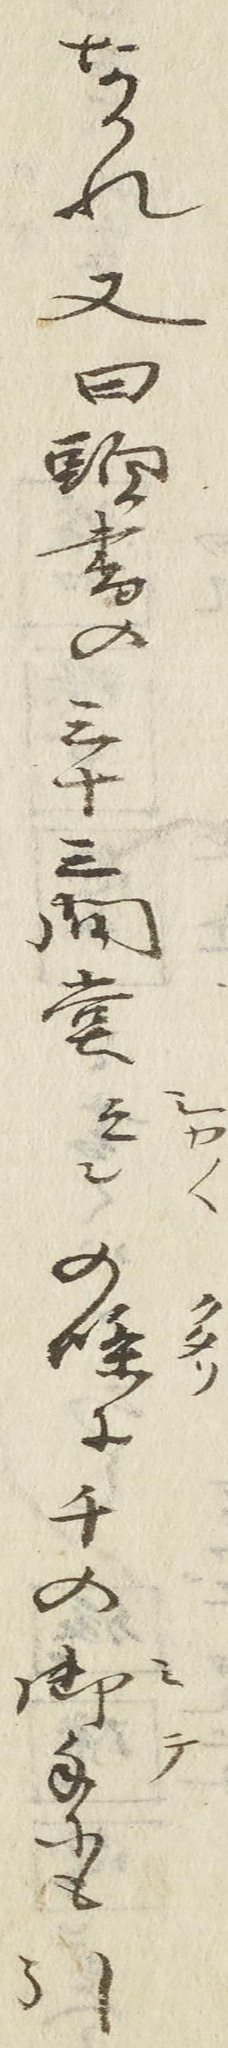なかれ又曰頭書の三十三間堂云〻の条に千の御手にも引
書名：やぶれ窓の記　全
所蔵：東京大学地震研究所図書室 Earthquake Research Institute Library, The University of Tokyo, JAPAN
